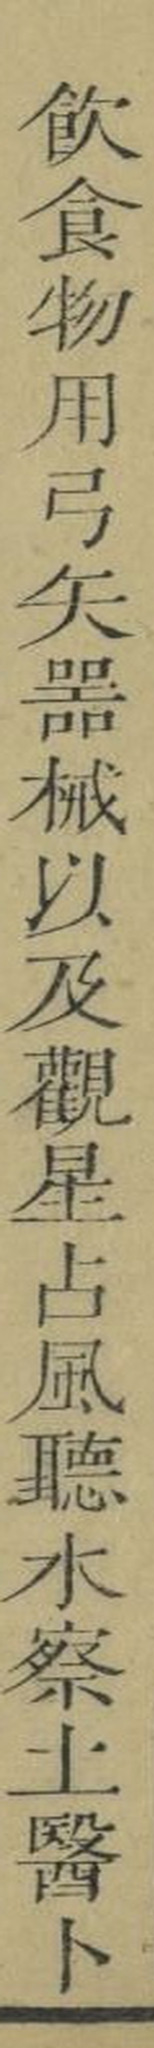飲食物用弓矢器械以及観星占風聴水察土医卜
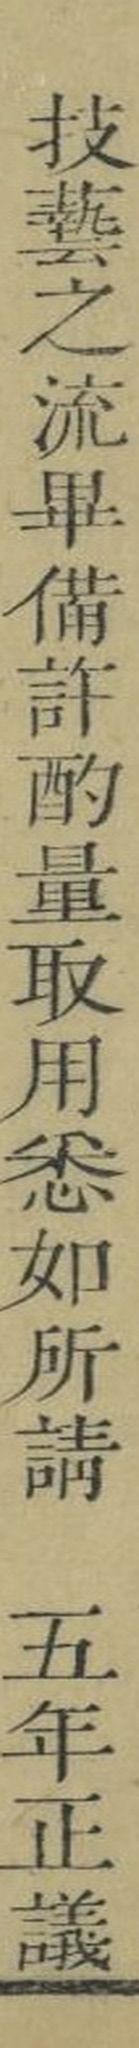技芸之流畢備許酌量取用悉如所請五年正議
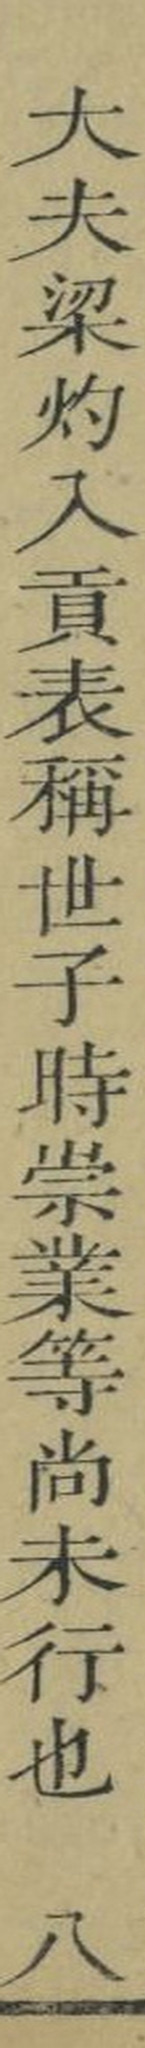大夫梁灼入貢表称世子時崇業等尚未行也八
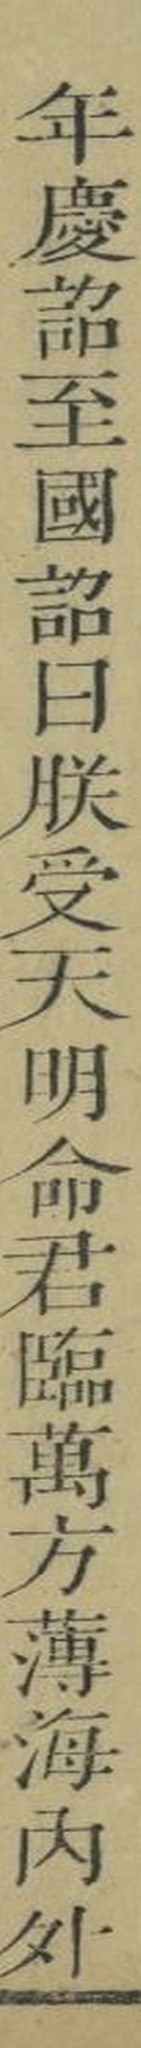年慶詔至国詔曰朕受天明命君臨万方薄海内外
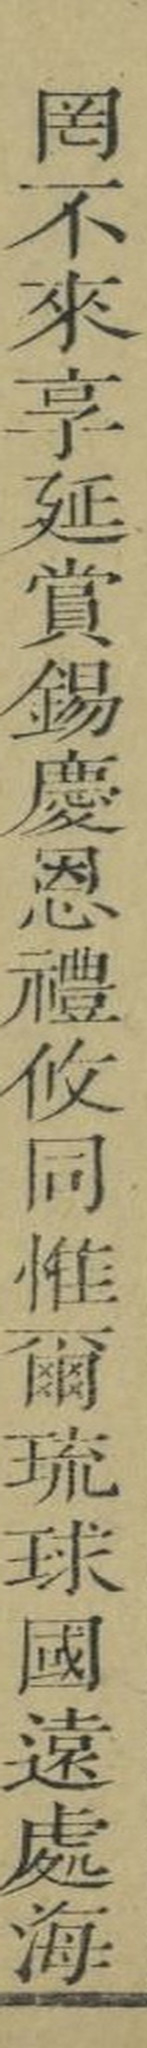罔不来享延賞錫慶恩礼攸同惟爾琉球国遠処海
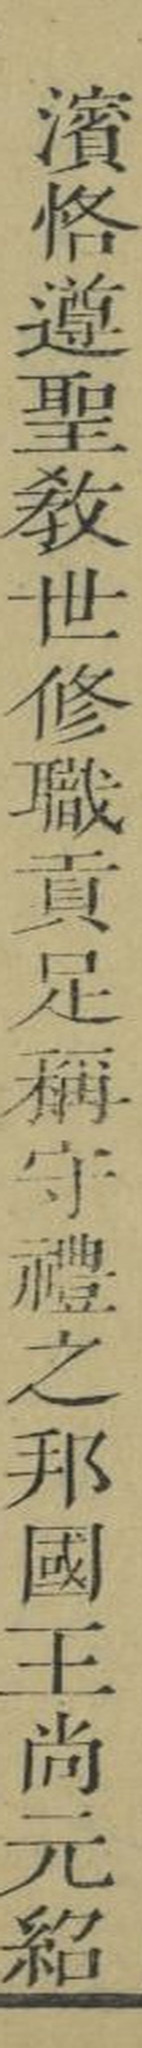浜恪遵聖教世修職貢足称守礼之邦国王尚元紹
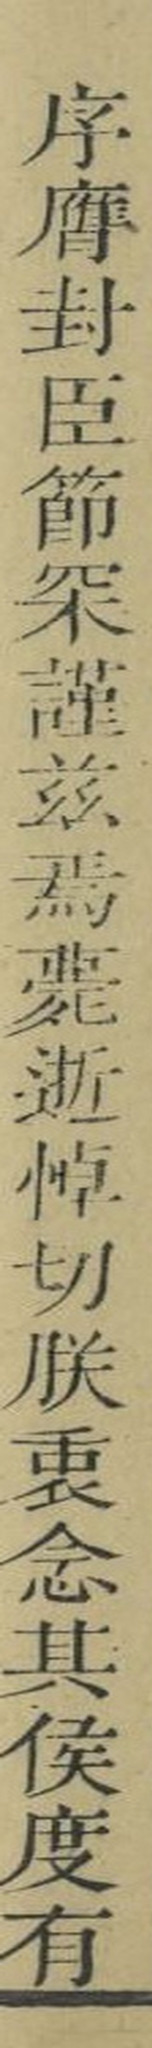序膺封臣節罙謹茲焉薨逝悼切朕衷念其侯度有
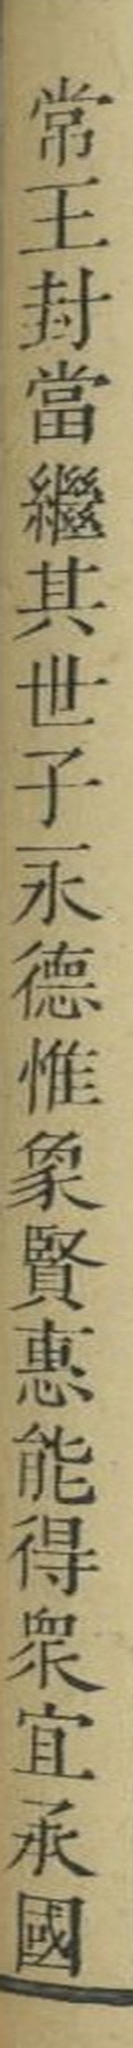常王封当継其世子永徳惟象賢恵能得衆宜承国
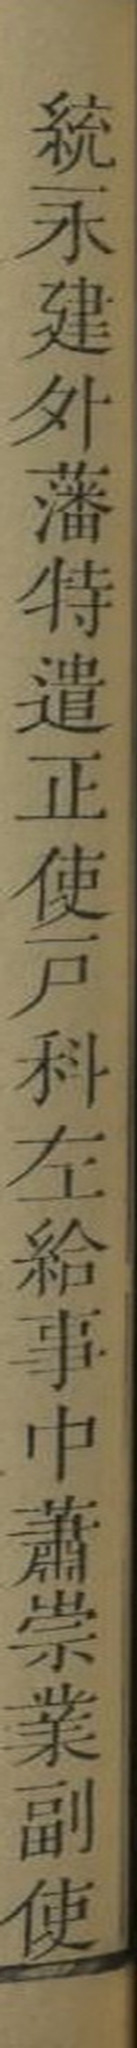統永建外藩特遣正使戸科左給事中蕭崇業副使
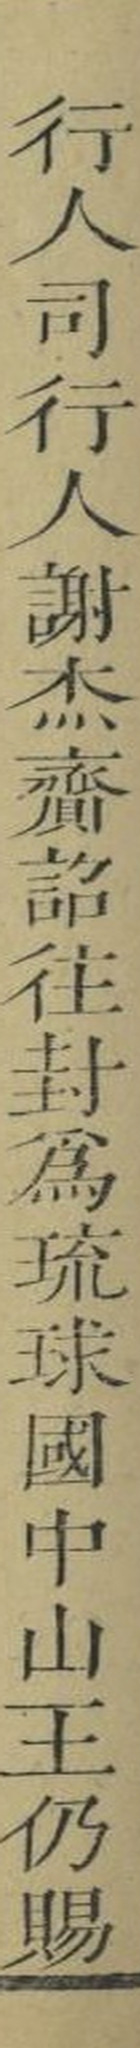行人司行人謝杰齎詔往封為琉球国中山王仍賜
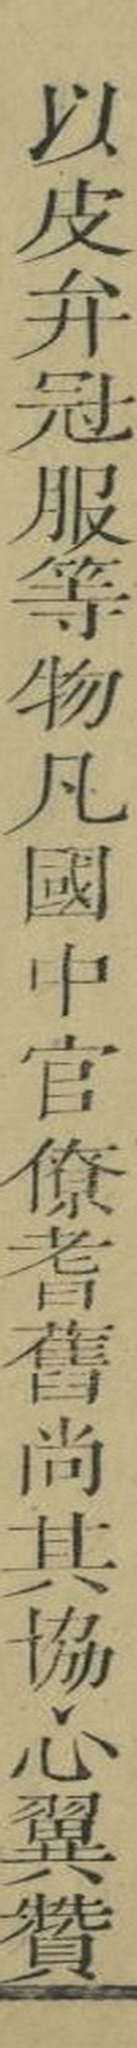以皮弁冠服等物凡国中官僚耆旧尚其協心翼賛
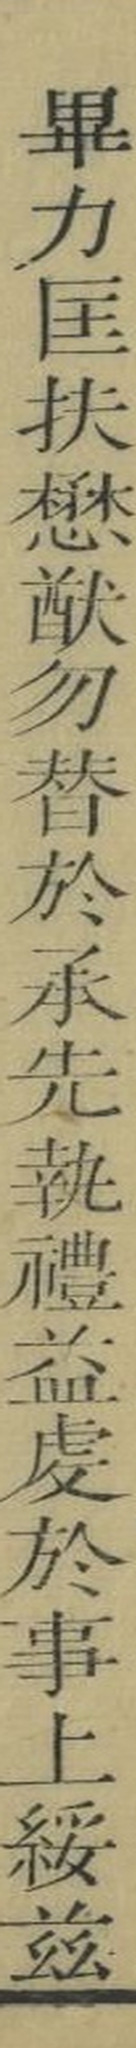畢力匡扶懋猷勿替於承先執礼益虔於事上綏茲
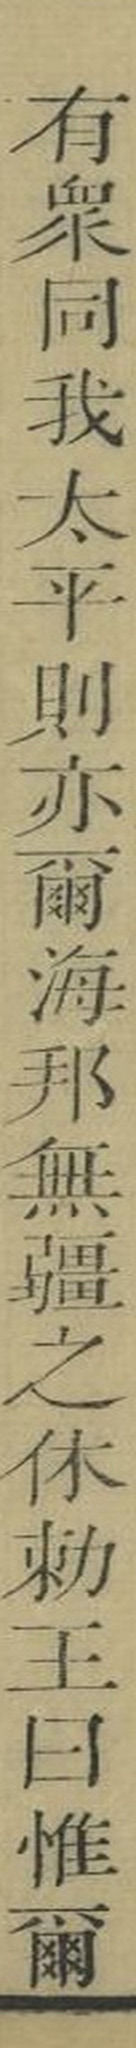有衆同我太平則亦爾海邦無疆之休勅王曰惟爾
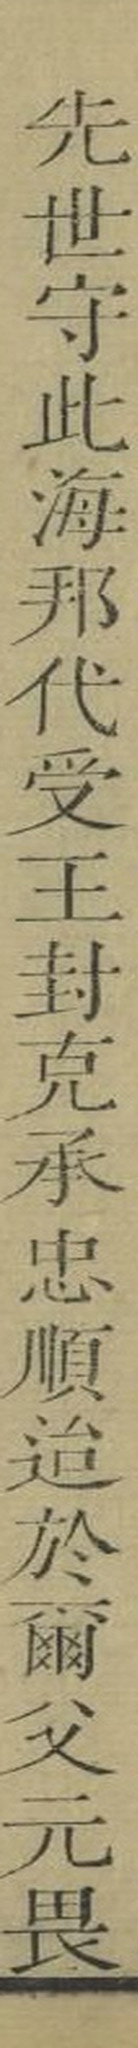先世守此海邦代受王封克承忠順迨於爾父元畏
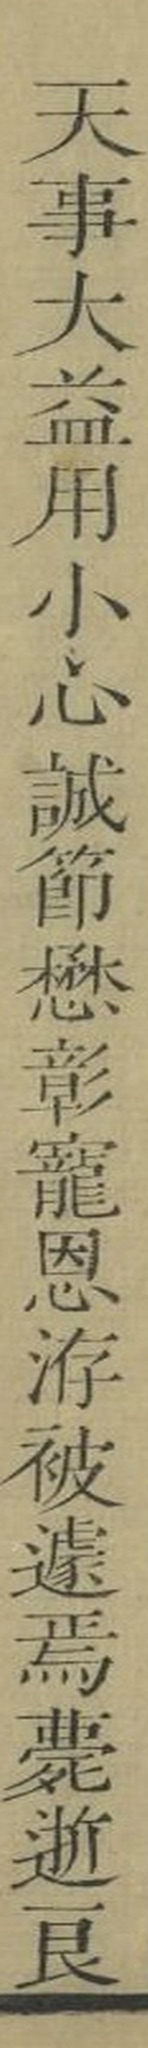天事大益用小心誠節懋彰寵恩洊被遽焉薨逝良
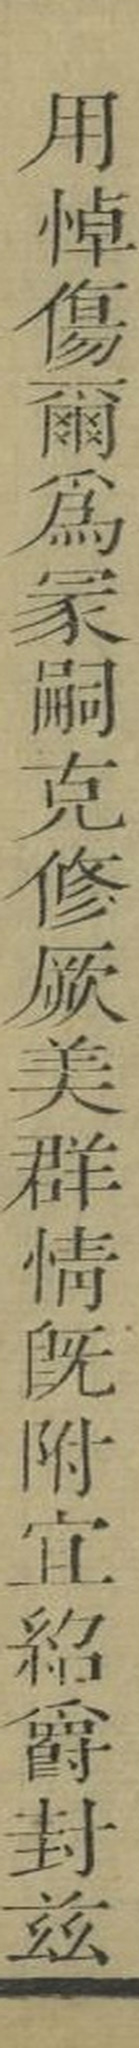用悼傷爾為冡嗣克修厥美群情既附宜紹爵封茲
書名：中山伝信録 巻三
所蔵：University of the Ryukyus Library
